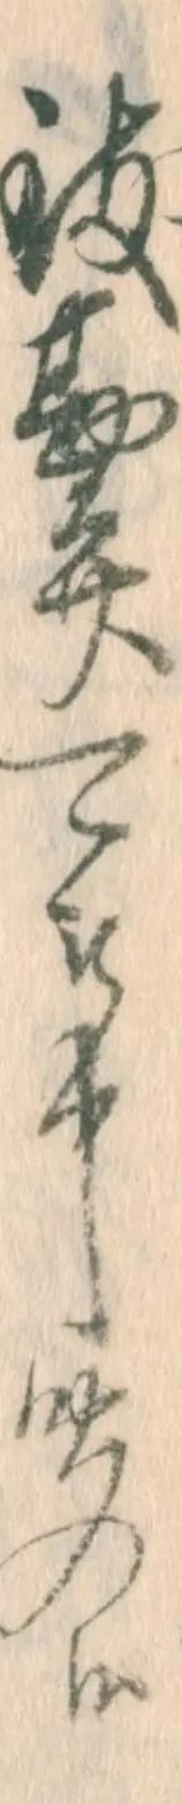致勘弁可被申聞候

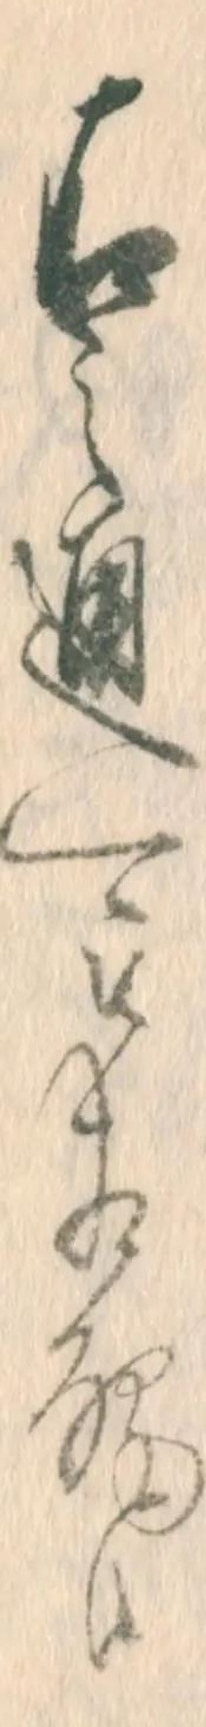右之通可被相触候
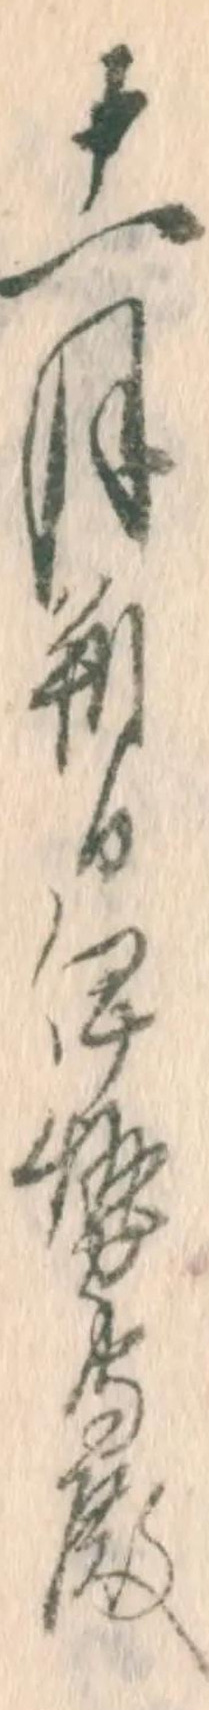十一月朔日伊勢守殿
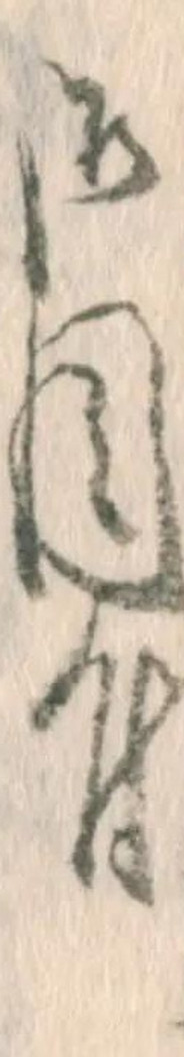御目付
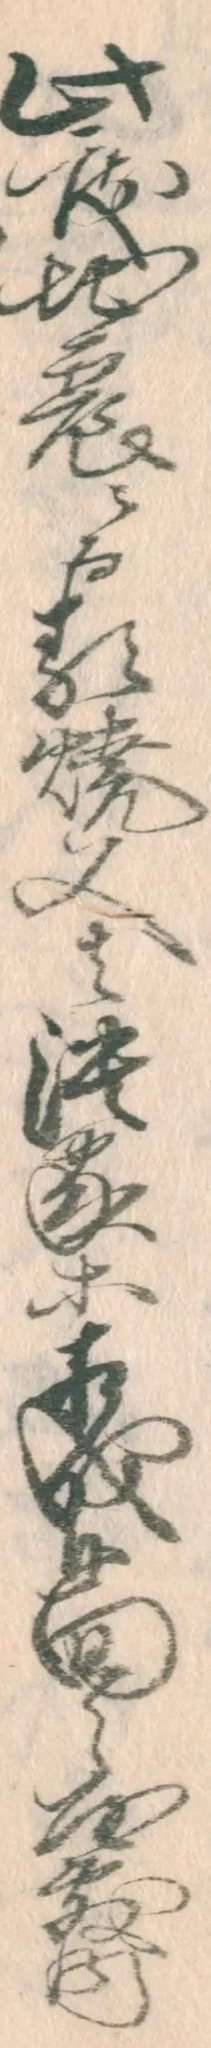此度地震ニ而類焼又は潰家等相成候面々屋敷内
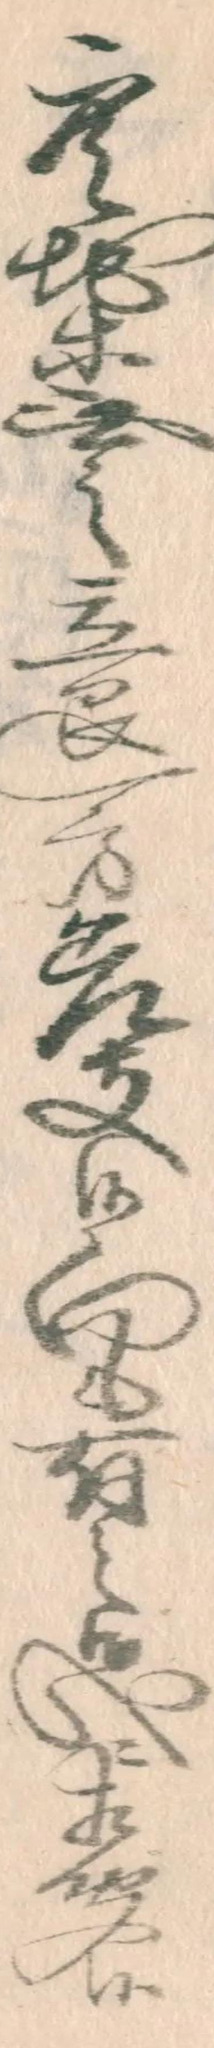空地等無之立退方差支候向も有之候哉二相聞候
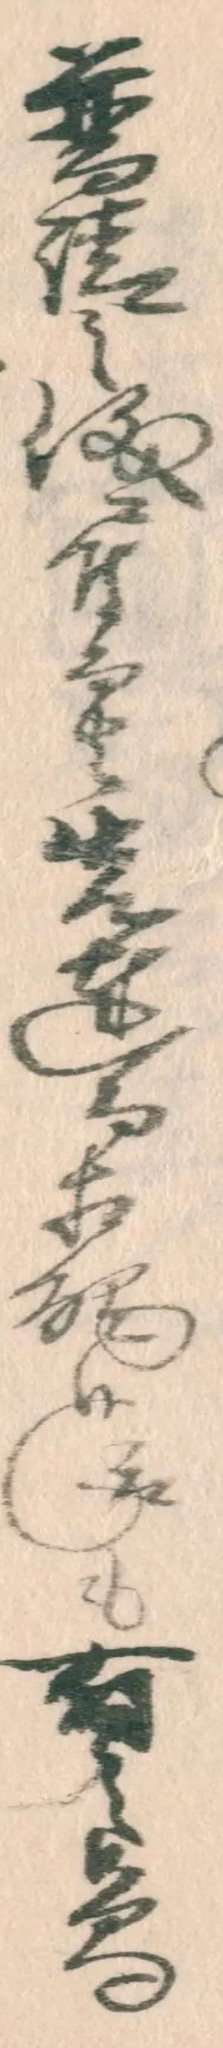普請之儀ニ付而は先達而相触候趣も有之候間
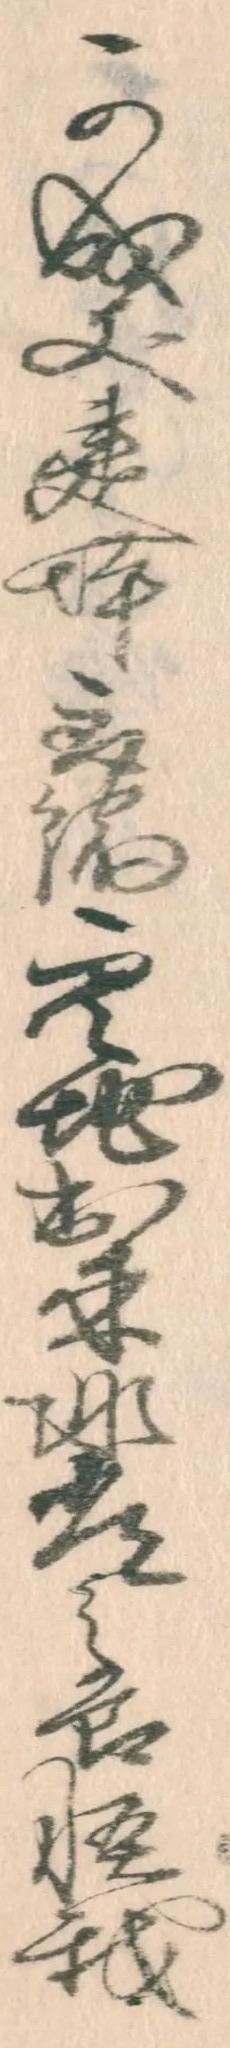可成丈建坪取縮空地出来非常之節怪我
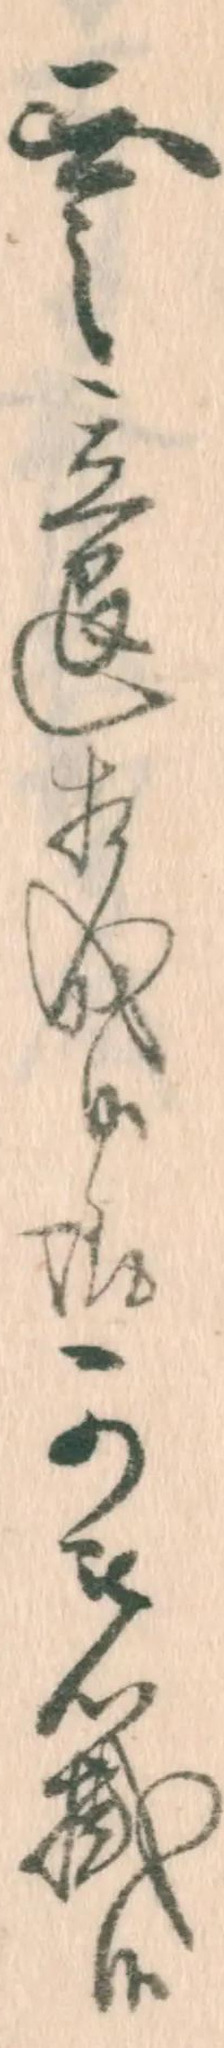無之立退相成候趣可被心掛候
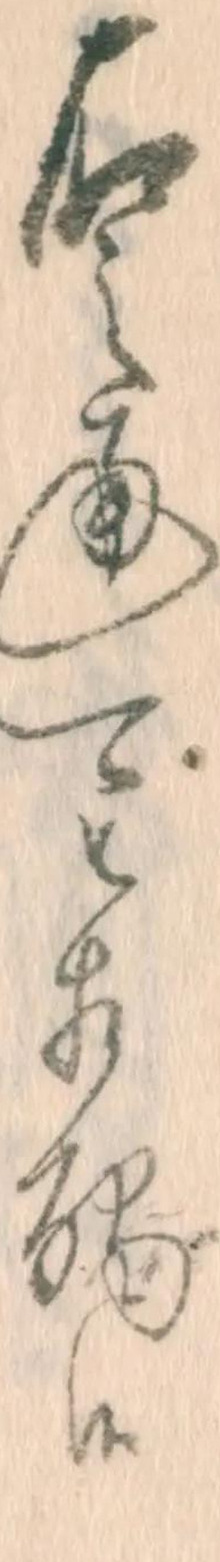右之通可被相触候
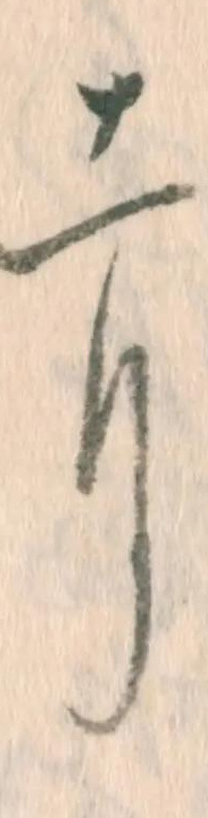十一月
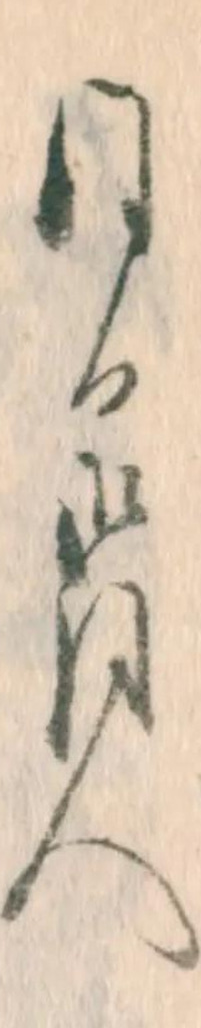同日御同人
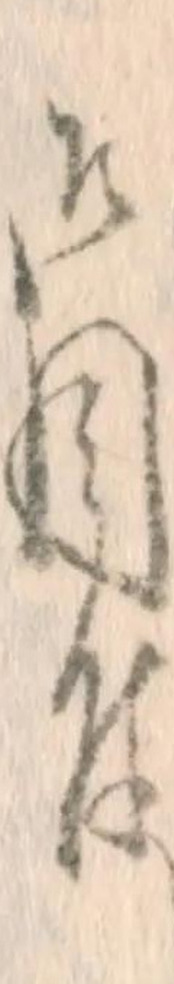御目付
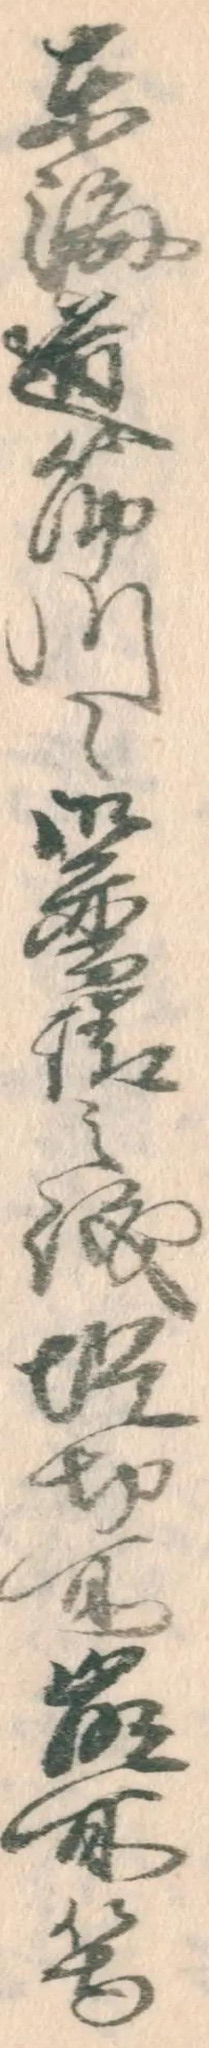東海道筋川々御普請之儀堤切所崩所等
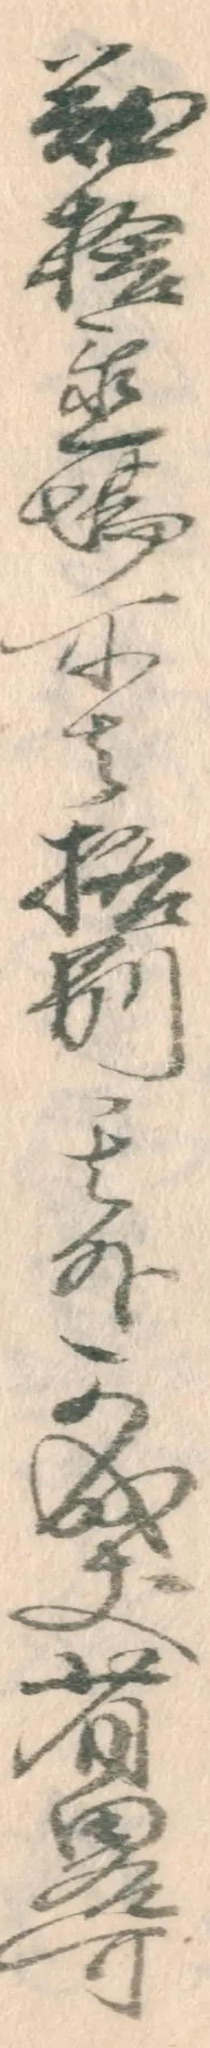難捨置場所は格別其外可成丈省略可
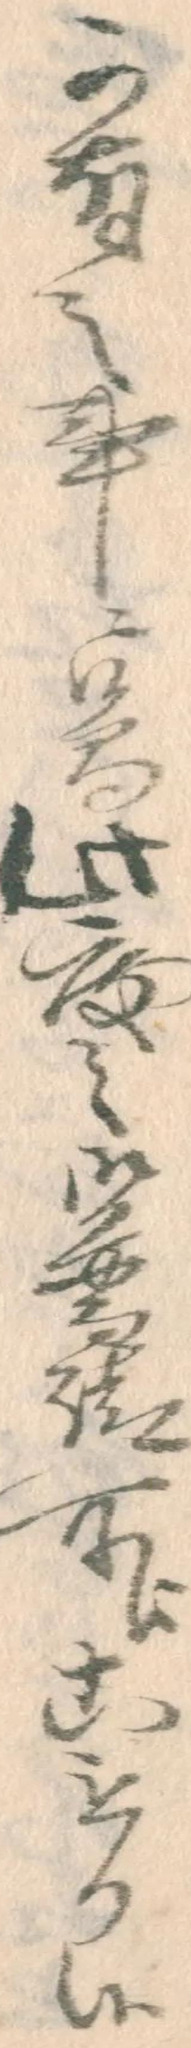可有之事ニ候間此度之御普請所えこもり候
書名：地震災書留 2巻. [1] 内表紙に「地震災書留　安政二卯年　但本所深川御用屋敷地代免除調」とあり
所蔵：国立国会図書館 National Diet Library, JAPAN
